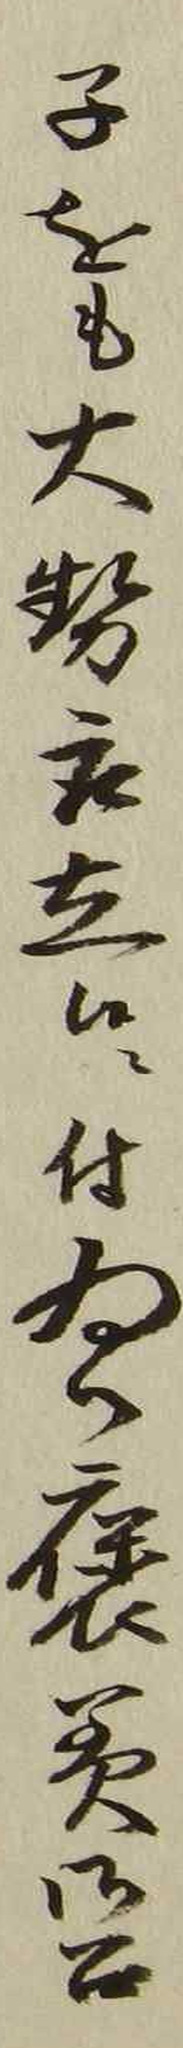子をも大勢取立候ニ付為御褒美御召
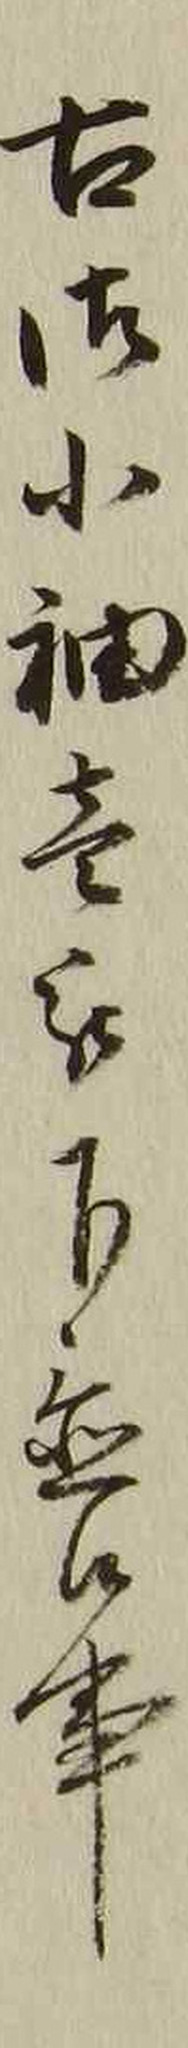古御小袖壱被下置候事
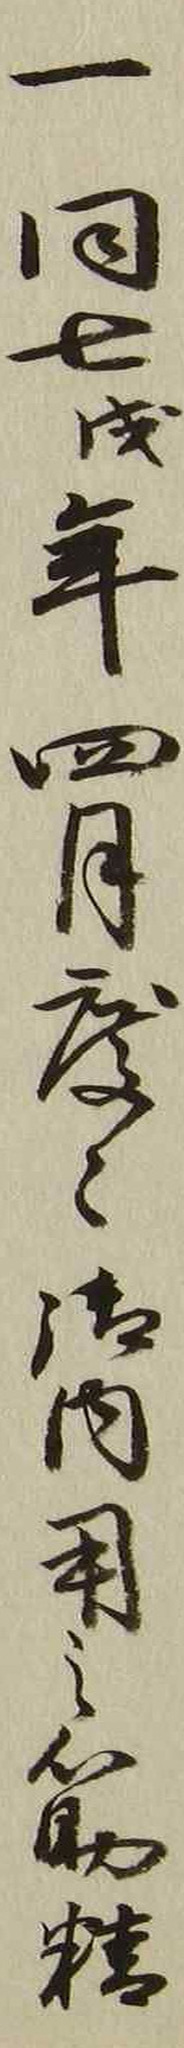一同七戌年四月度々御内用之筋精
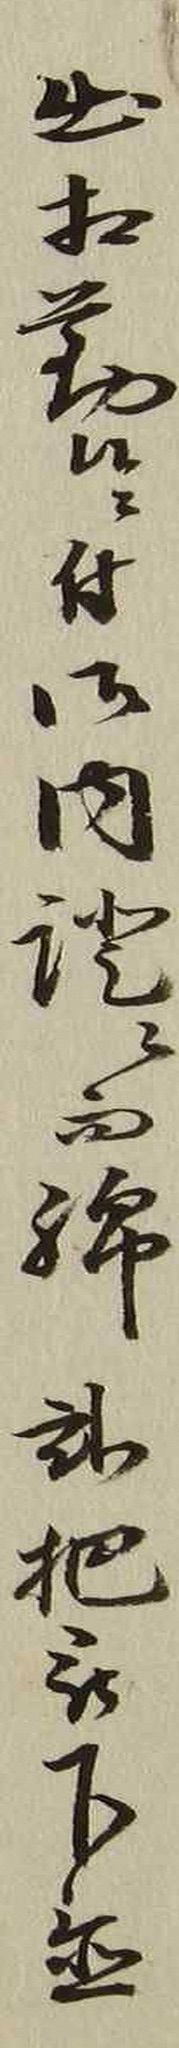出相勤候ニ付御内証ニ而綿弐把被下置
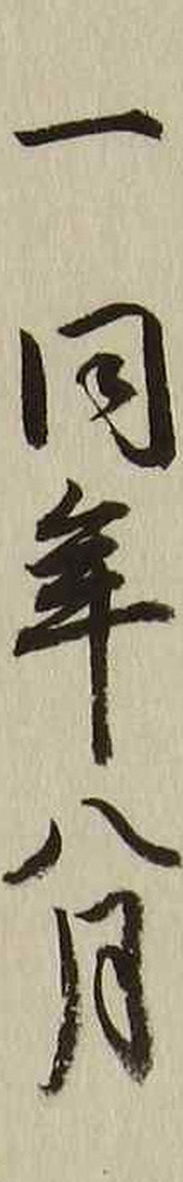一同年八月
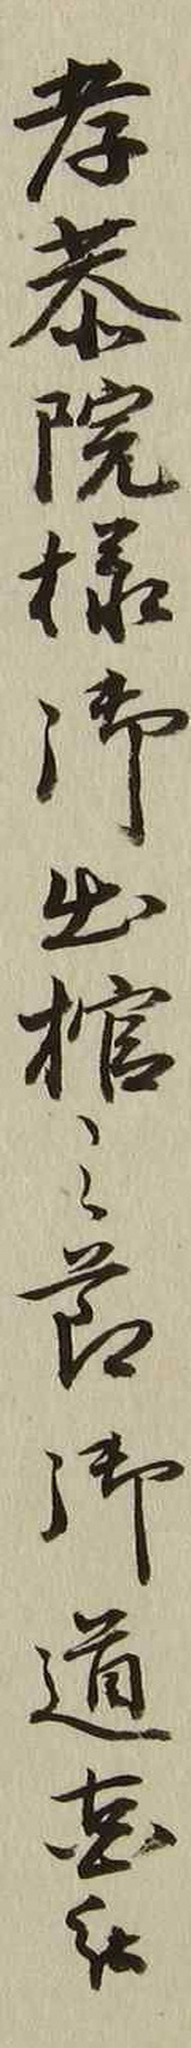孝恭院様御出棺之節御道固被
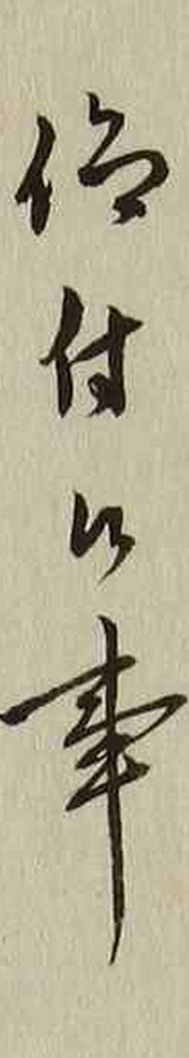仰付候事
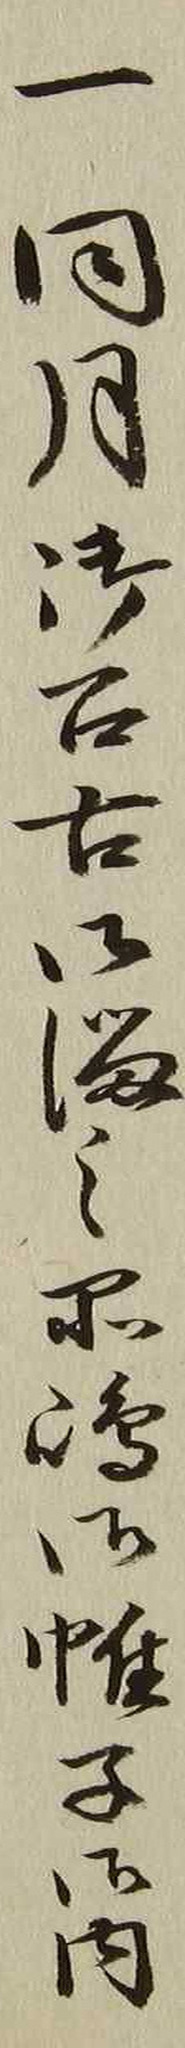一同月御召古御溜之品嶋御帷子御内
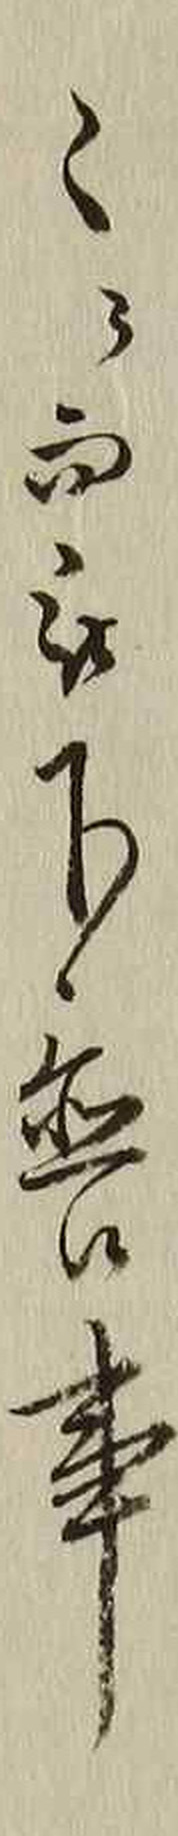々ニ而被下置候事
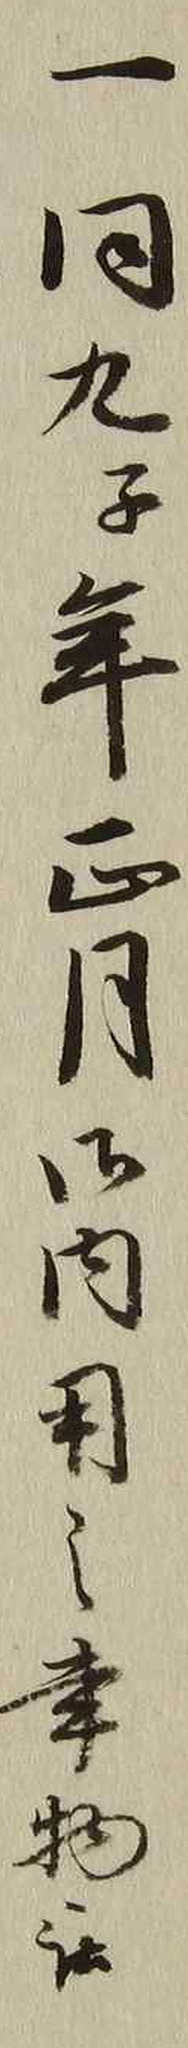一同九子年正月御内用之書物被
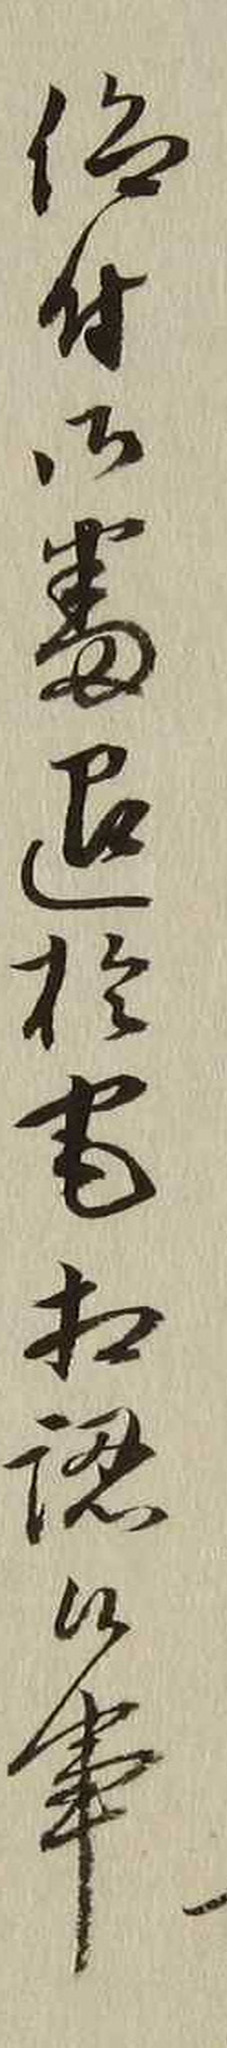仰付御番退於も相認候事
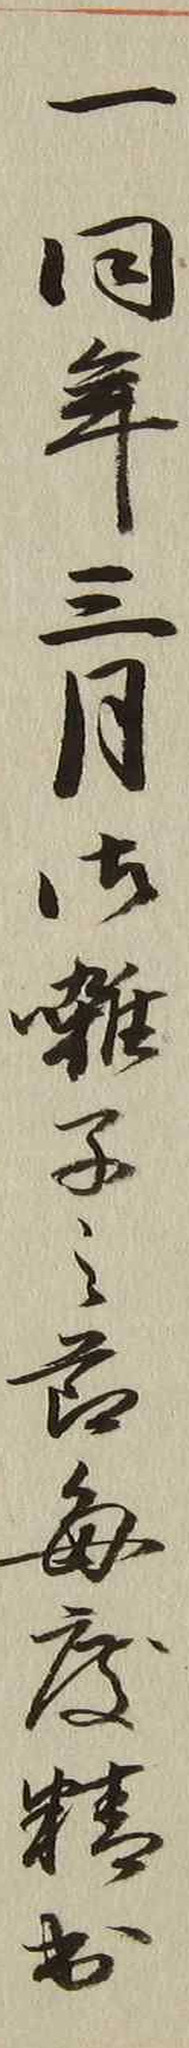一同年三月御囃子之節毎度精出
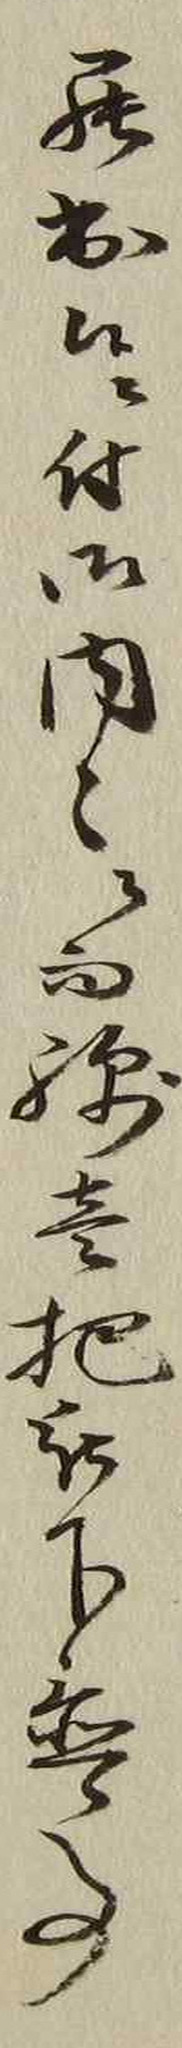罷出候ニ付御内々ニ而綿壱把被下置候事
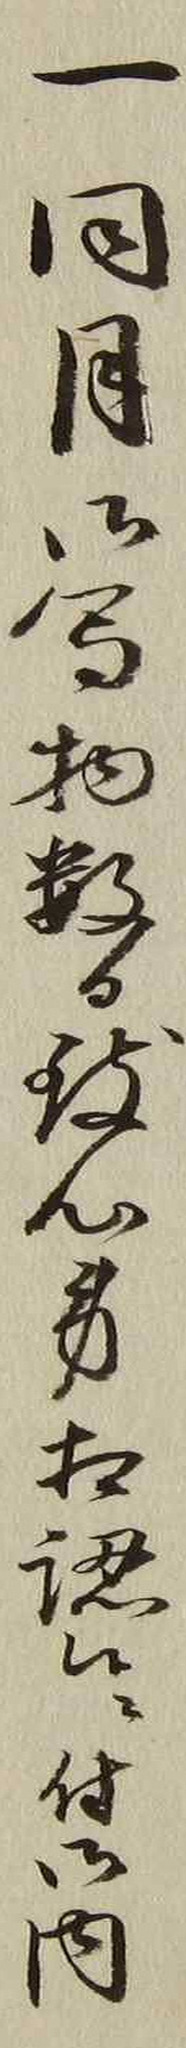一同月御写物数日致心労相認候ニ付御内
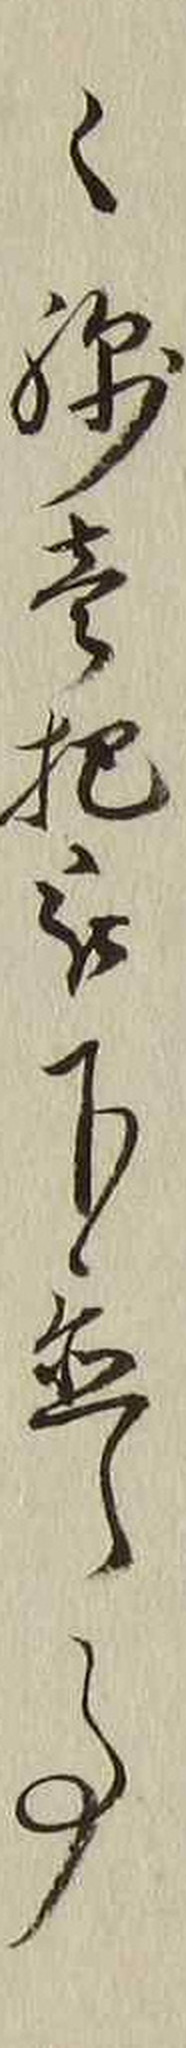々綿壱把被下置候事
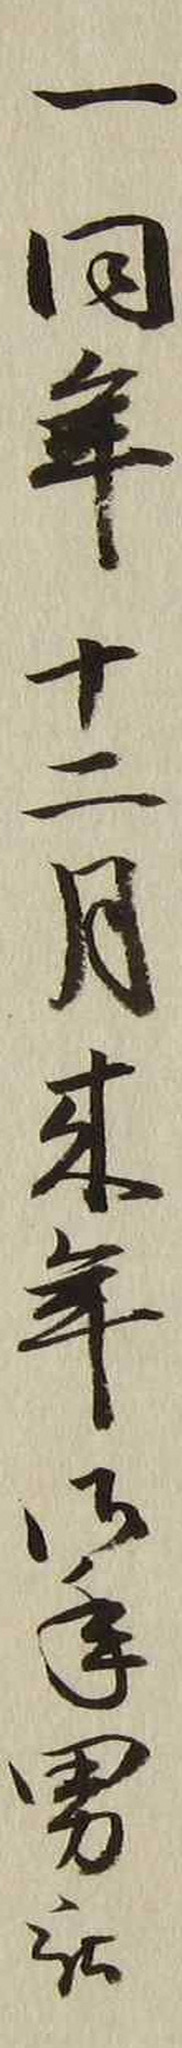一同年十二月来年御年男被
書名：諸士系譜　巻之61　と之部4
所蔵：会津若松市立会津図書館
